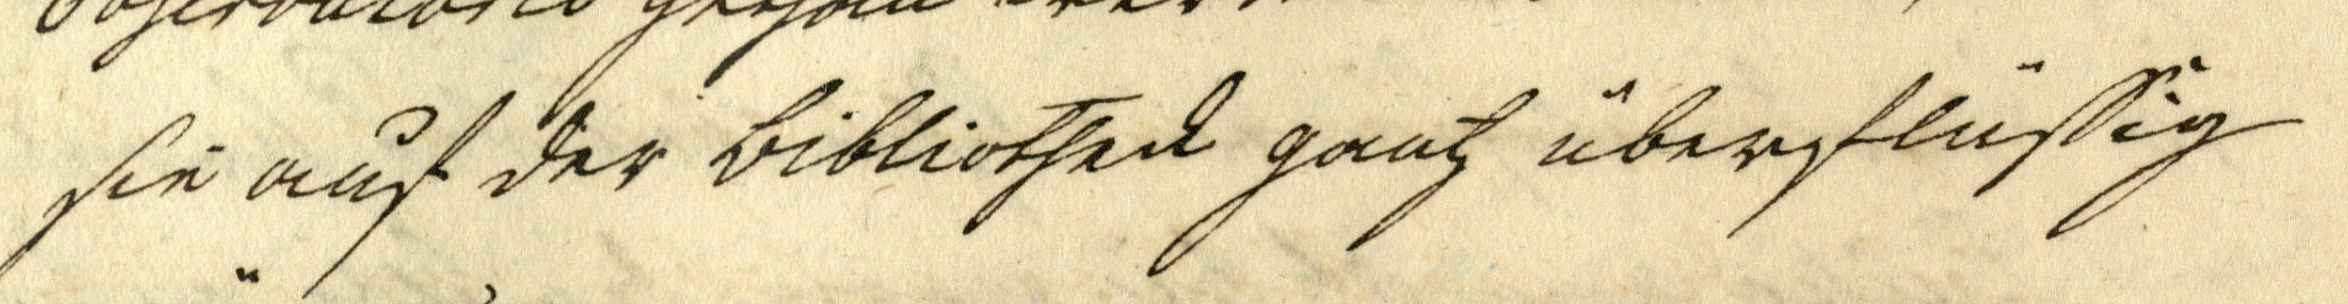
sie auf der Bibliotheck gantz überflüssig
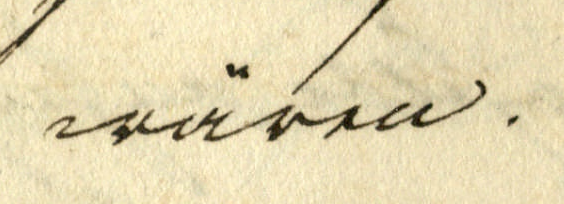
wären.
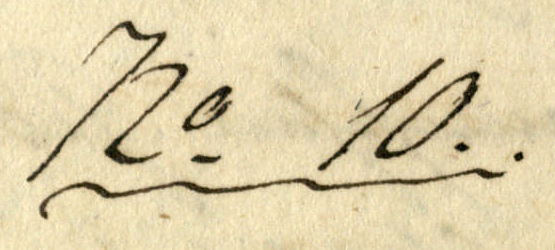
No 10.
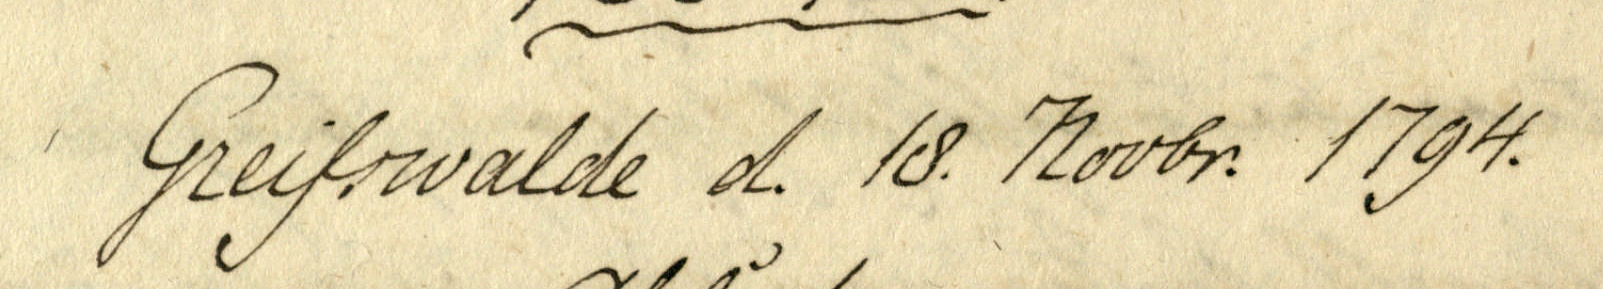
Greifswalde d. 18. Novbr. 1794.
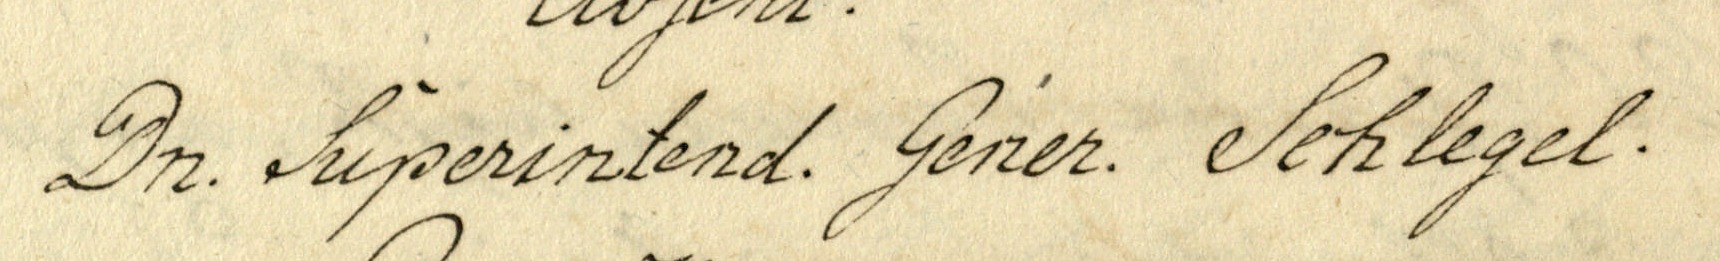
Dn. Superintend. Gener. Schlegel.
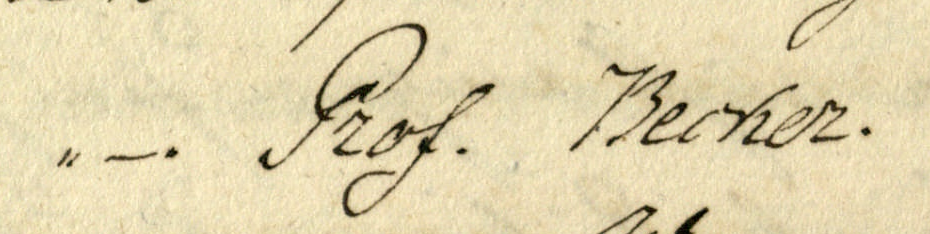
Prof. Becker.
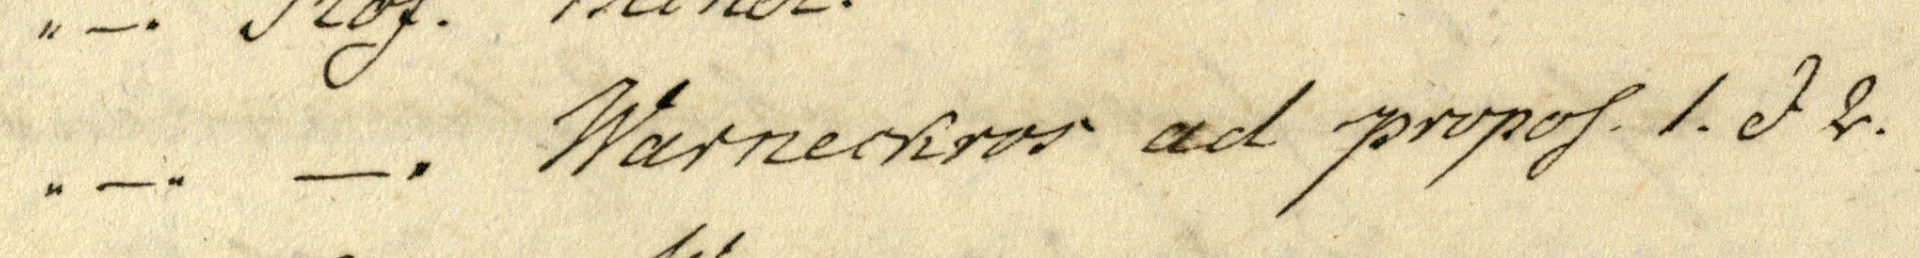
Warneckros ad propos. 1. et 2.
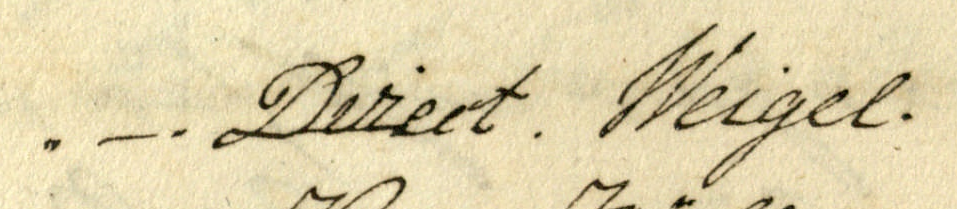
Direct. Weigel.
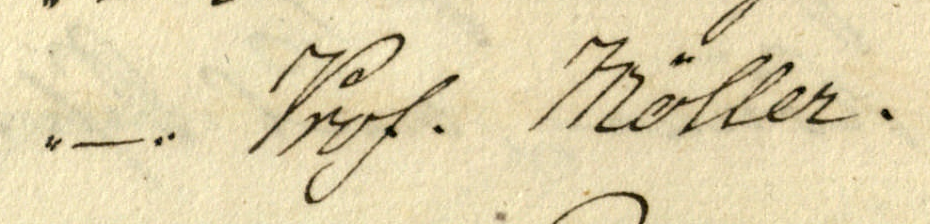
Prof. Möller.
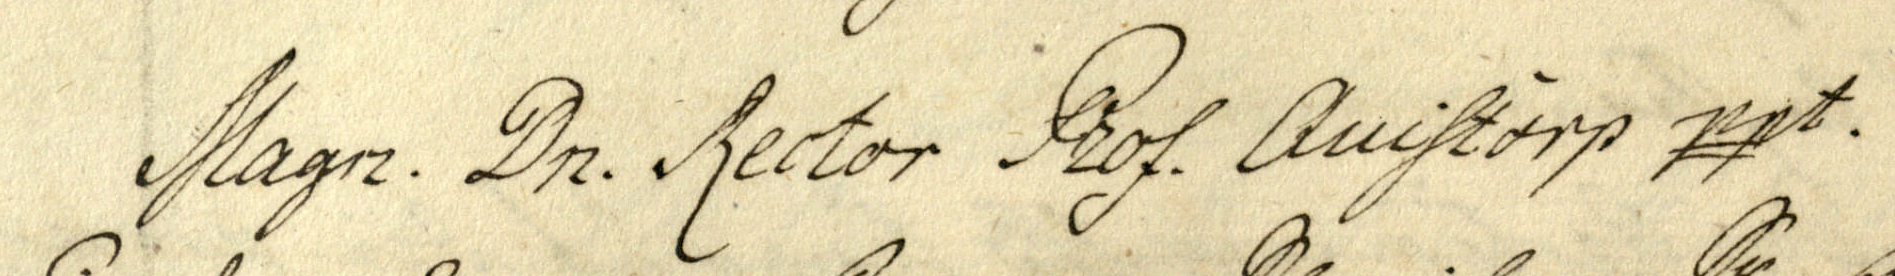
Magn. Dn. Rector Prof. Quistorp ppt.
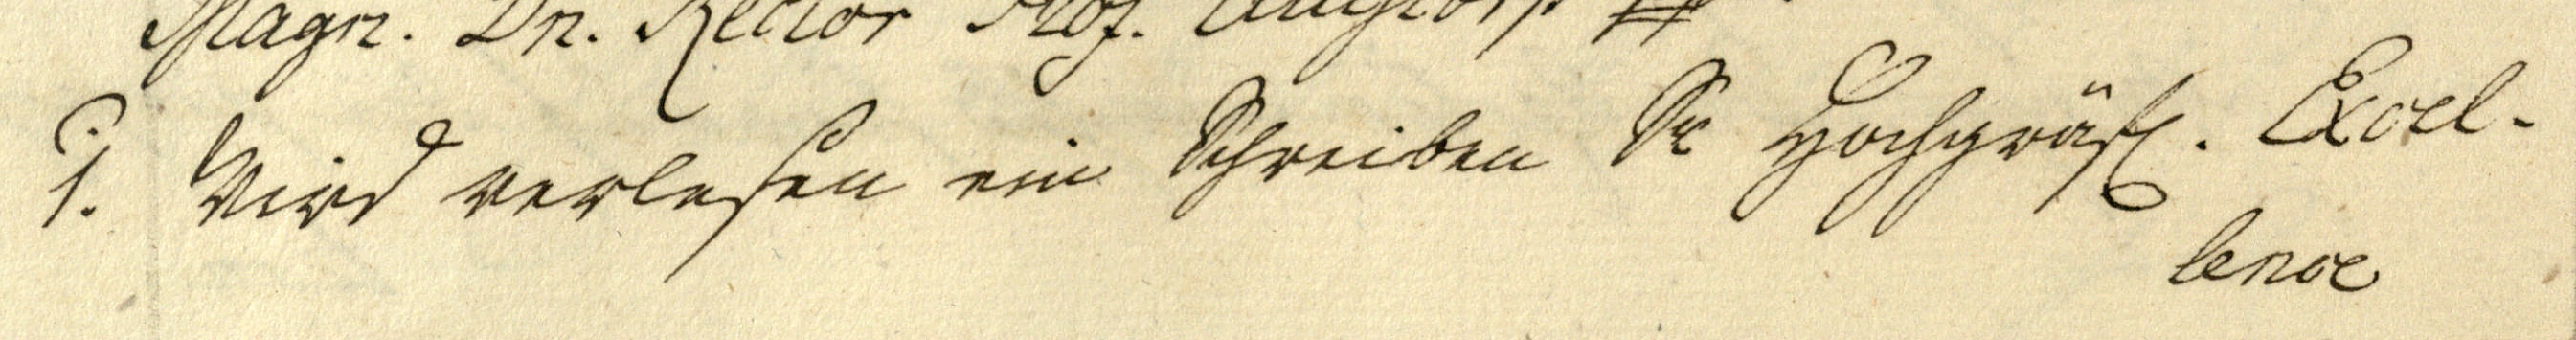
1. Wird verlesen ein Schreiben Sr Hochgräfl. Excel¬
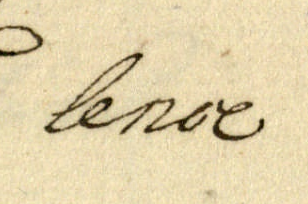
lence
